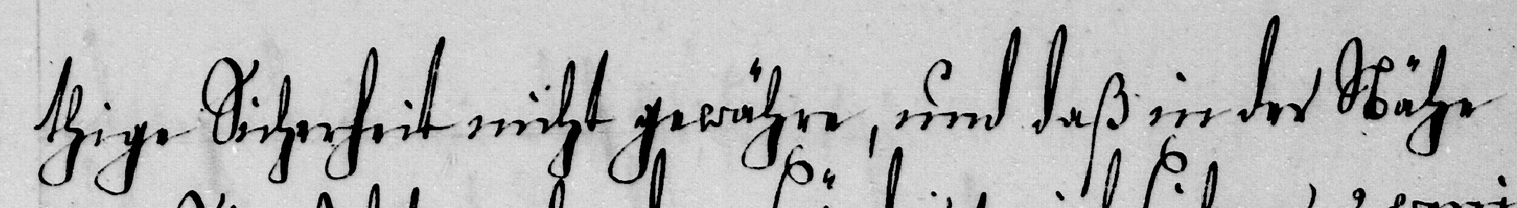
thige Sicherheit nicht gewähre, und daß in der Nähe
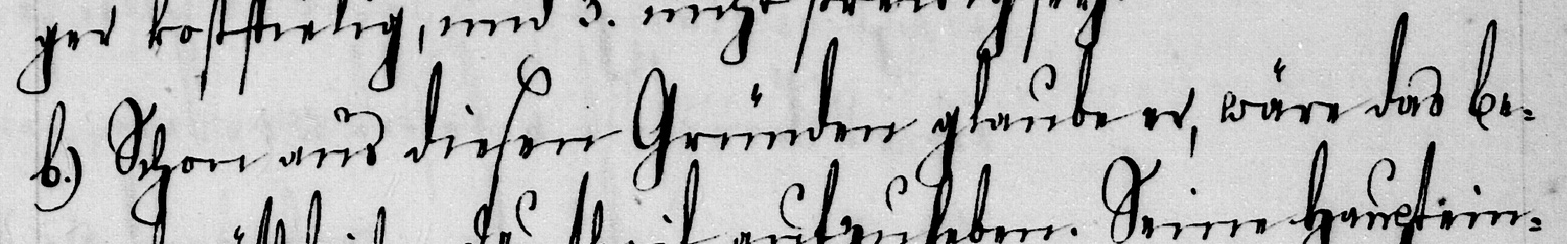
b.) Schon aus diesen Gründen glaube er, wäre das be¬
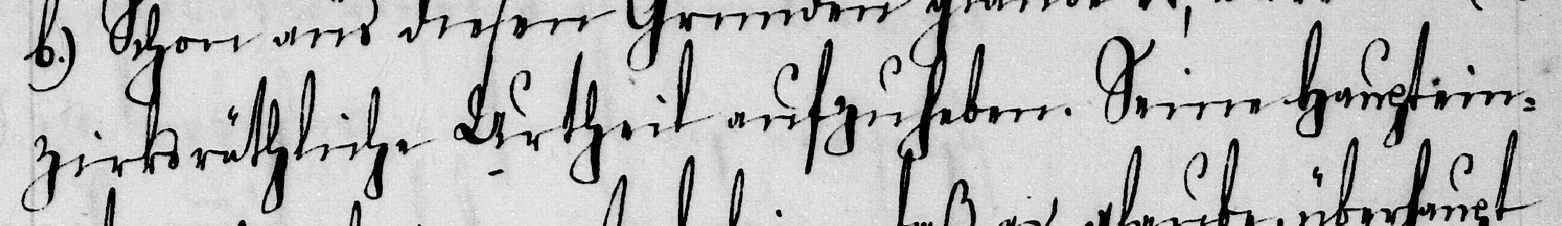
zirksräthliche Urtheil aufzuheben. Seine Hauptein¬
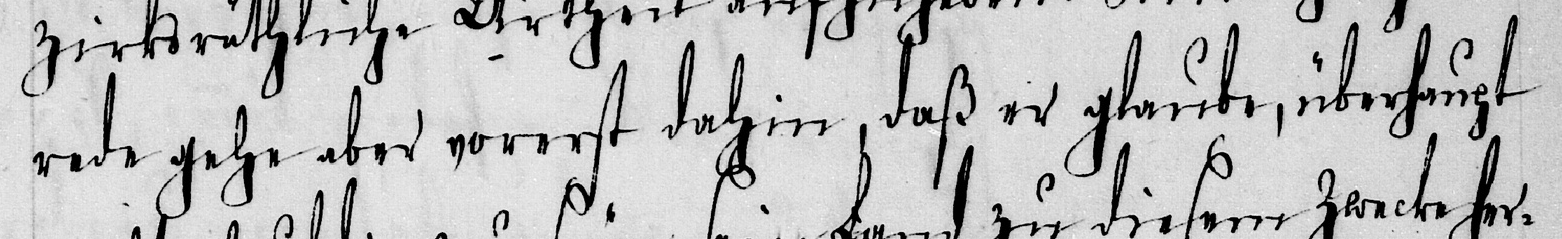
rede gehe aber vorerst dahin, daß er glaube, überhaupt
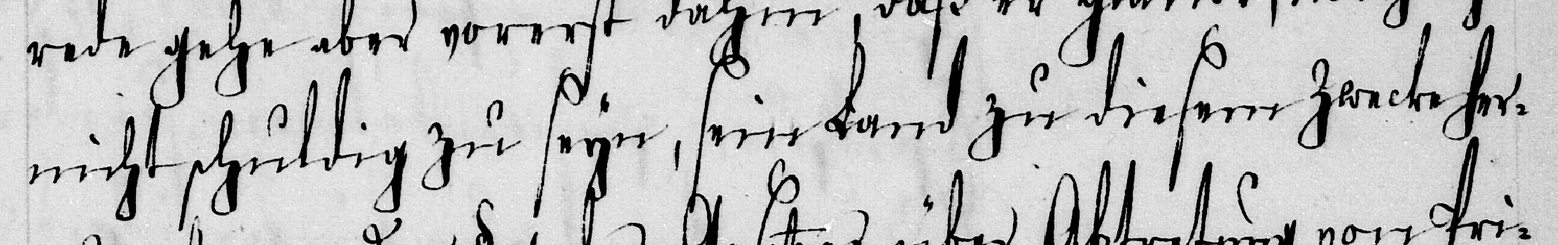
nicht schuldig zu seyn, sein Land zu diesem Zwecke her¬
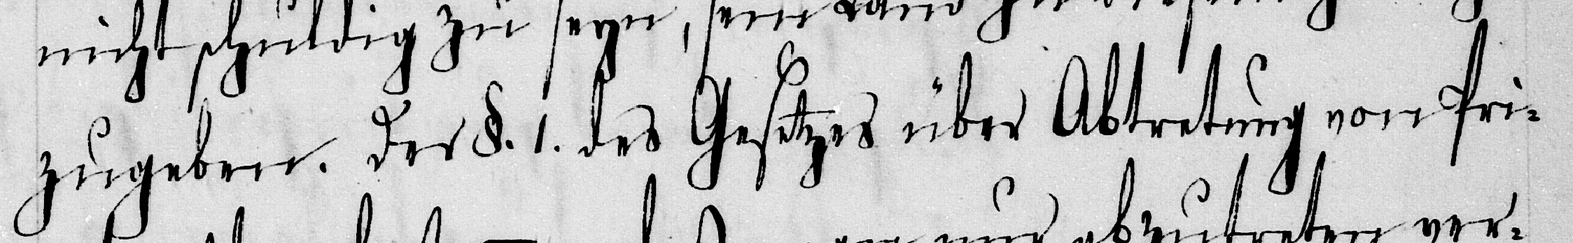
zugeben. Der §. 1. des Gesetzes über Abtretung von Pri¬
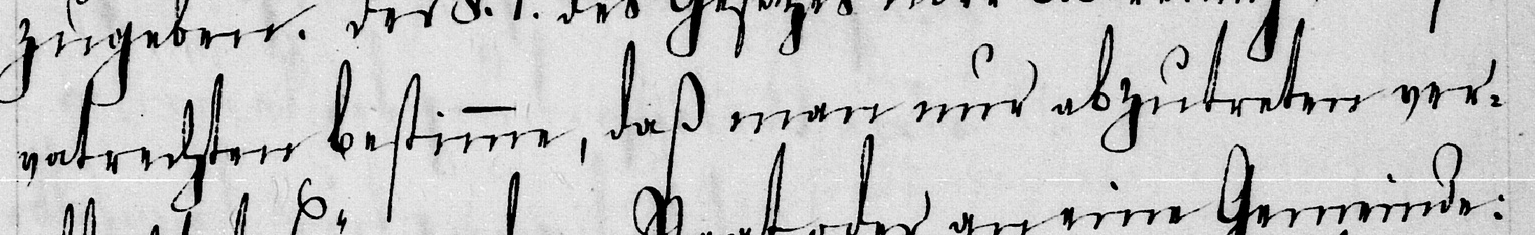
vatrechten bestimme, daß man nur abzutreten ver¬
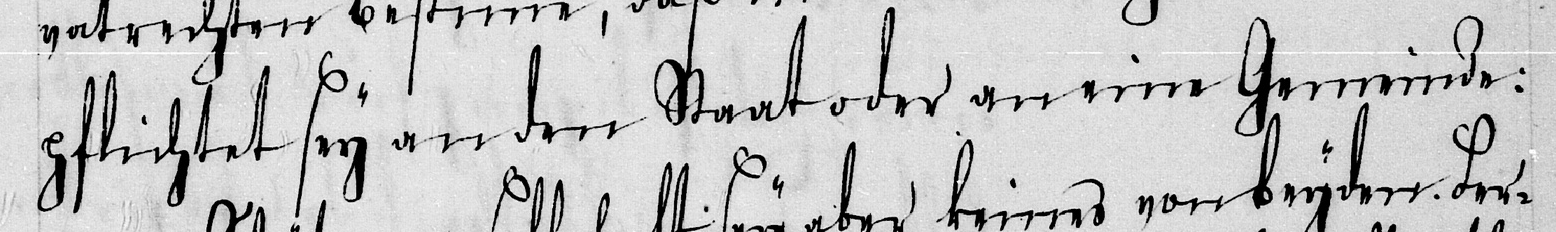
pflichtet sey an den Staat oder an eine Gemeinde:
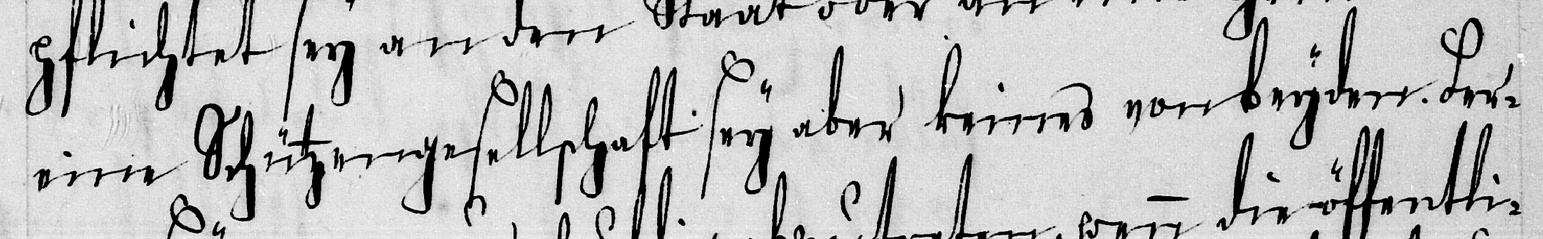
eine Schützengesellschaft sey aber keines von beyden. Fer¬
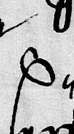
c.)
